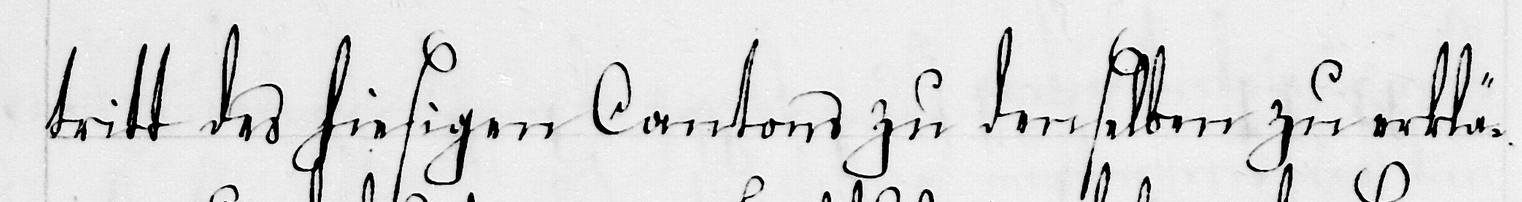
tritt des hiesigen Cantons zu denselben zu erklä¬
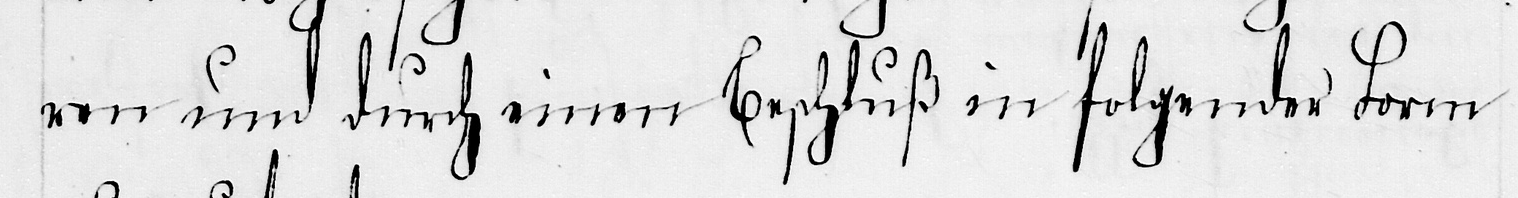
ren und durch einen Beschluß in folgender Form
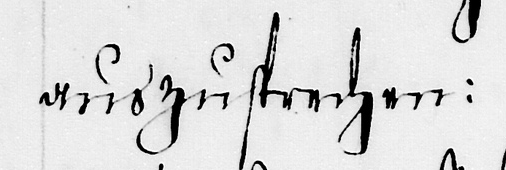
auszusprechen:
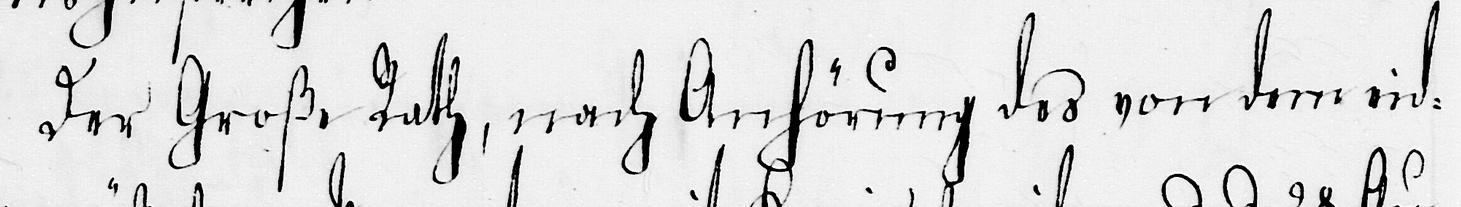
Der Große Rath, nach Anhörung des von dem eid¬
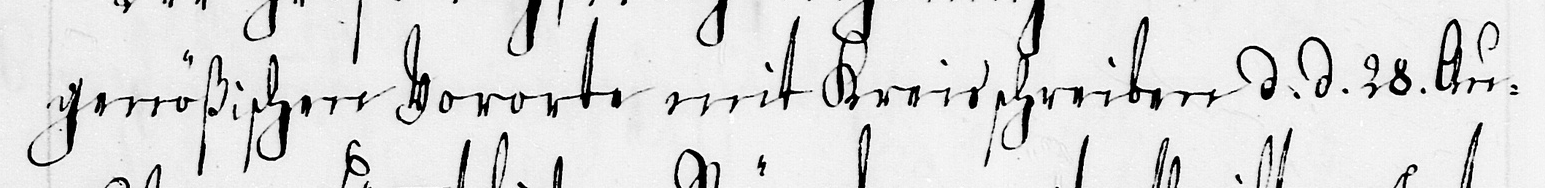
genößischen Vororte mit Kreisschreiben d. d. 28. Au¬
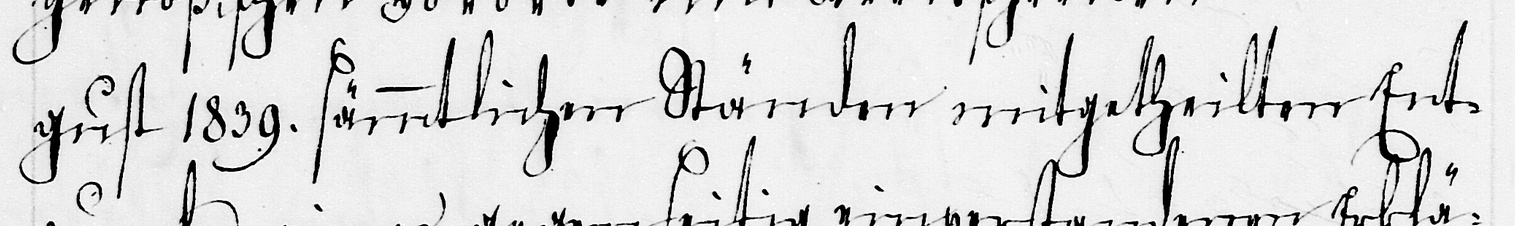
gust 1839. sämmtlichen Ständen mitgetheilten Ent¬
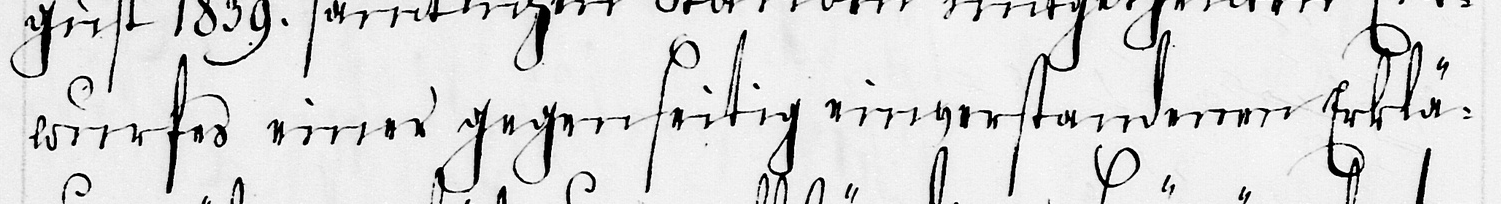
wurfes einer gegenseitig einverstandenen Erklä¬
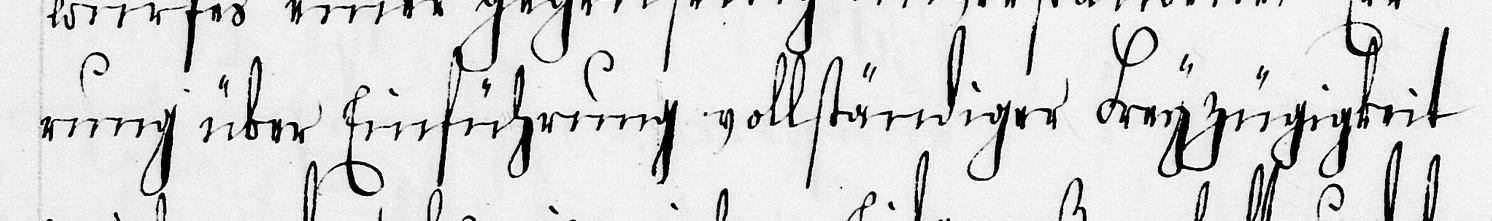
rung über Einführung vollständiger Freyzügigkeit
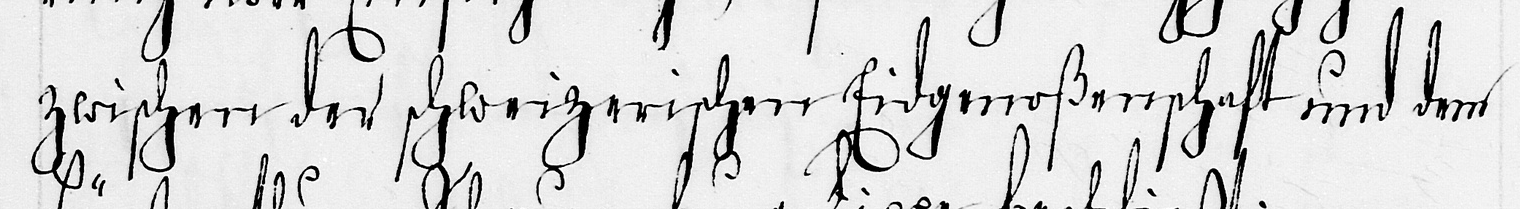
zwischen der schweizerischen Eidgenoßenschaft und dem
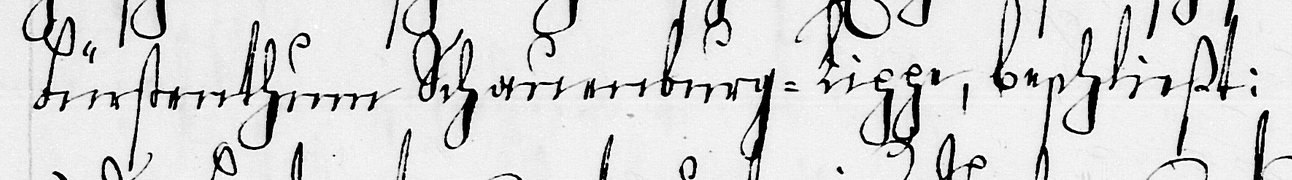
Fürstenthum Schauenburg-Lippe, beschließt:
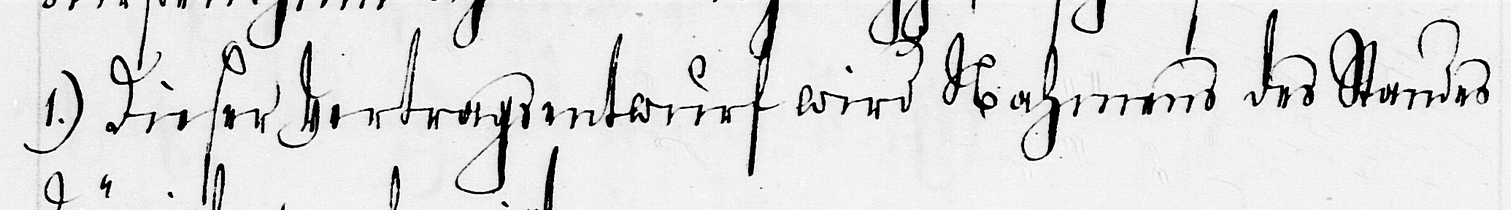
1.) Dieser Vertragsentwurf wird Nahmens des Standes
